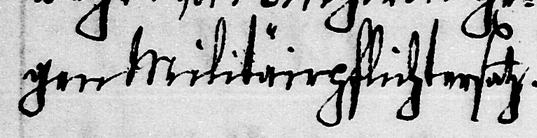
gten Militairpflichter¬
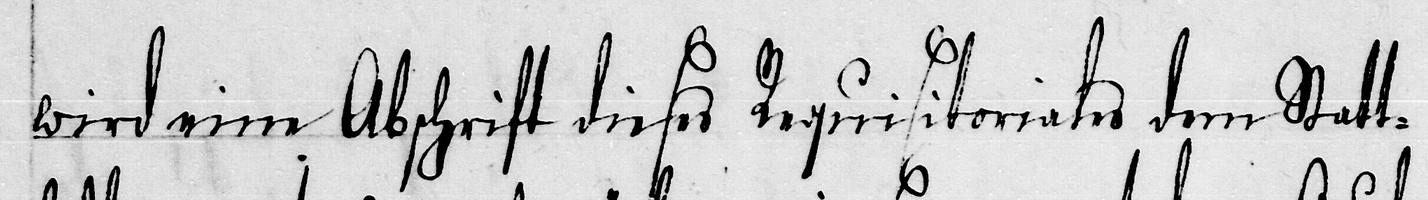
wird eine Abschrift dieses Requisitoriales dem Stat¬
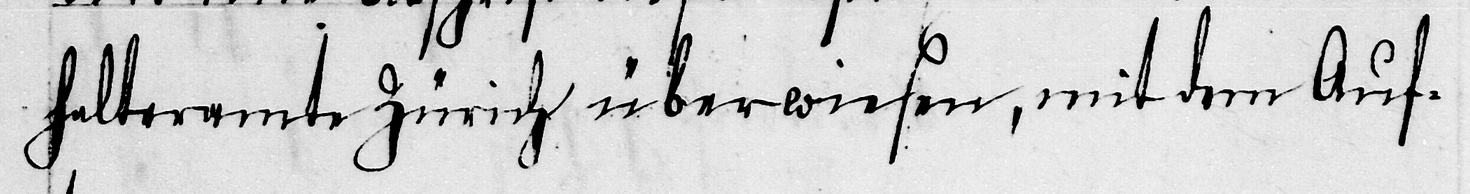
thalteramte Zürich überwiesen, mit dem Auf¬
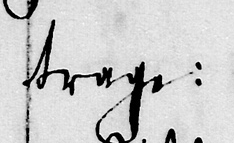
trage:
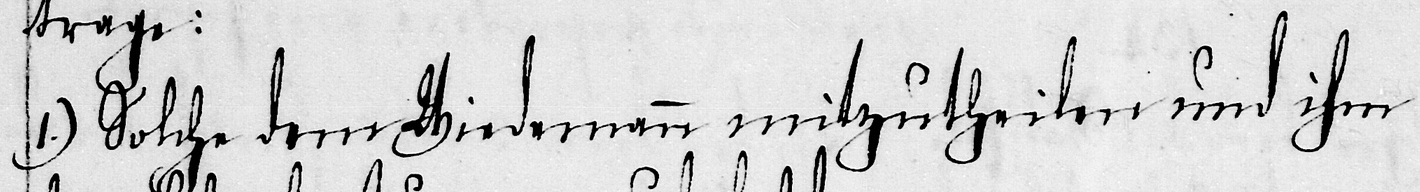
1.) Solche dem Wiedemann mitzutheilen und ihm
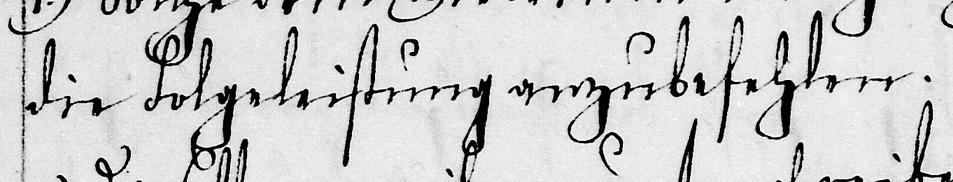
die Folgeleistung anzubefehlen.
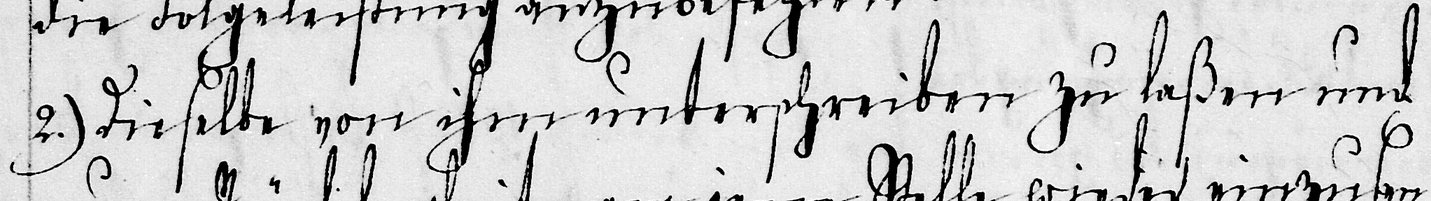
2.) Dieselbe von ihm unterschreiben zu laßen und
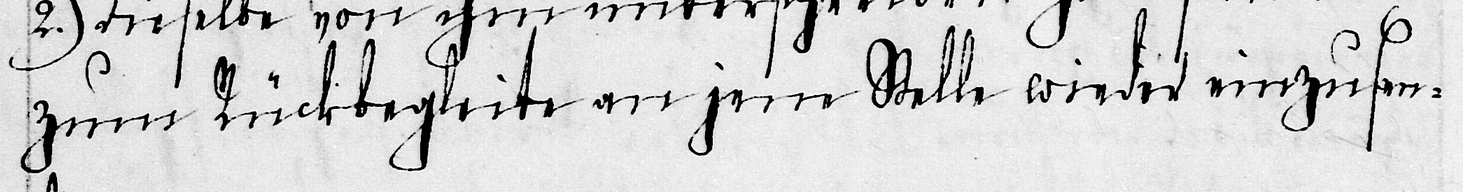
zum Rückbegleite an jene Stelle wieder einzusen¬
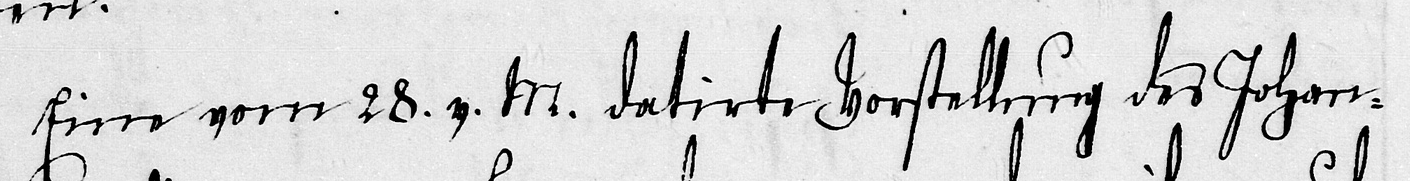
Eine vom 28. v. M. datirte Vorstellung des Johan¬
